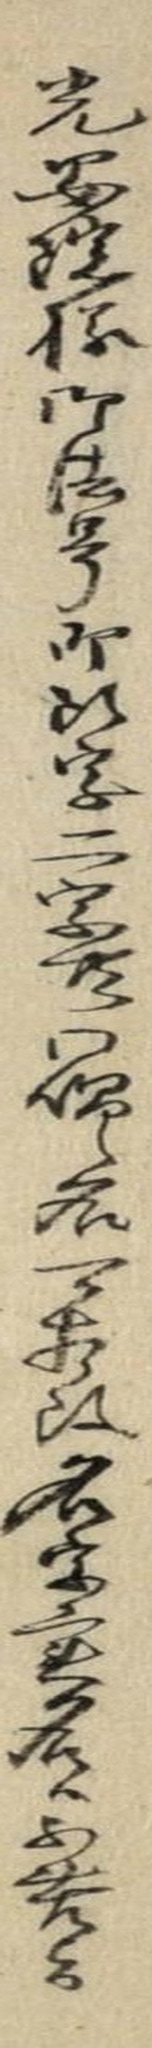光安院様御法号御頭字二字共に同唱之名可相改名字実名は不苦旨
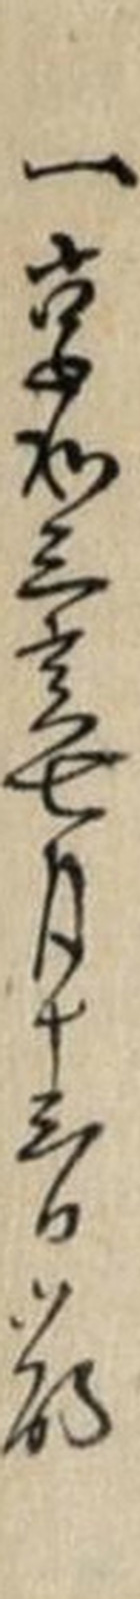一享和三亥七月十三日御触
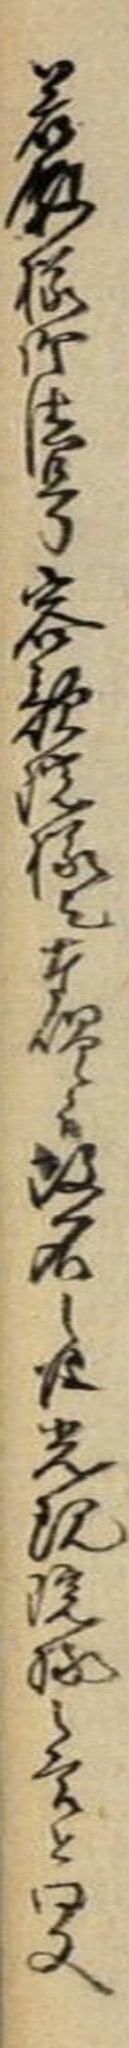若殿様御法号容顔院様と奉唱候に付改名之儀光現院様之節と同文
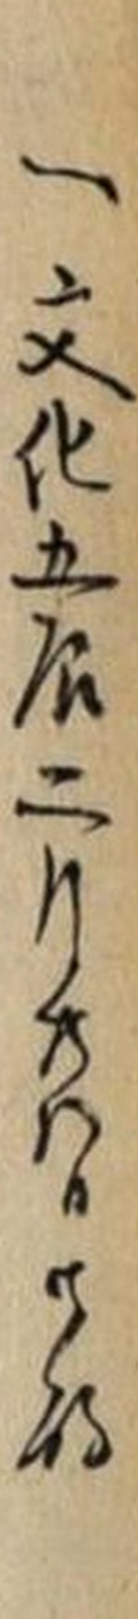一文化五辰二月廿八日御触
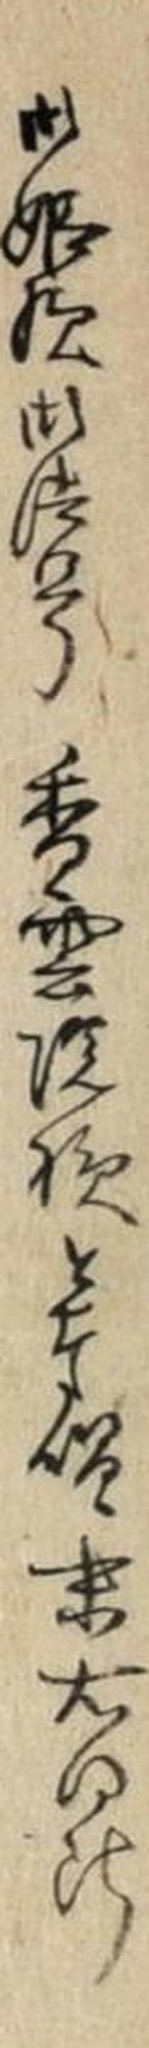御姫様御法号香雲院様と奉唱候末右同断
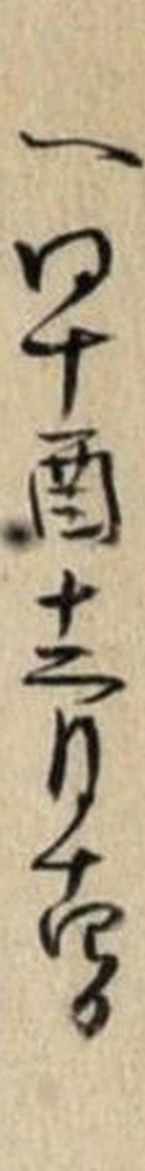一同十酉十二月十四日
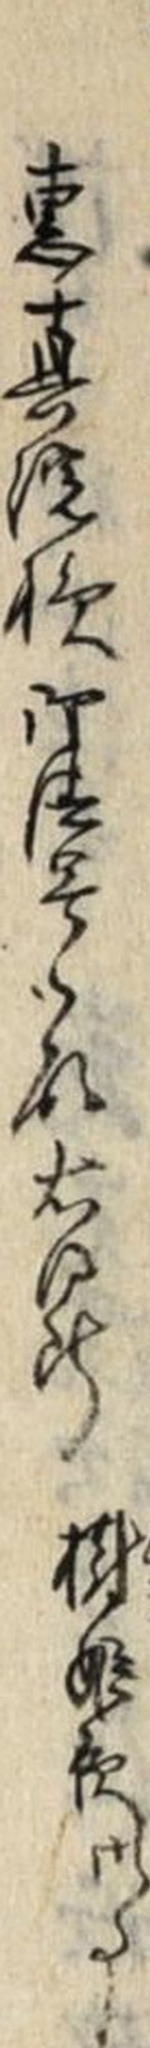恵真院様御法号御触右同断樹姫様御事
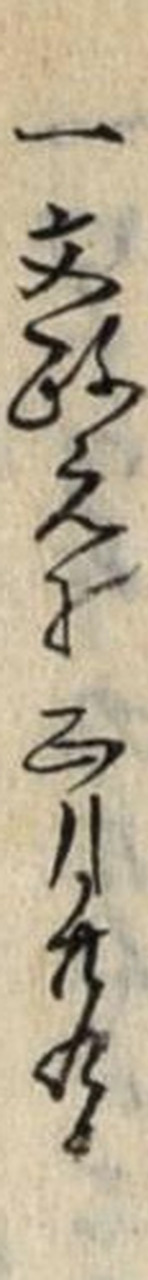一文政元寅正月廿九日
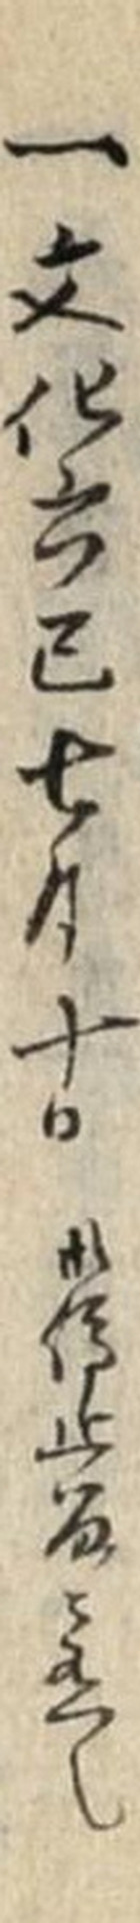一文化六巳七月十日御停止留に有之
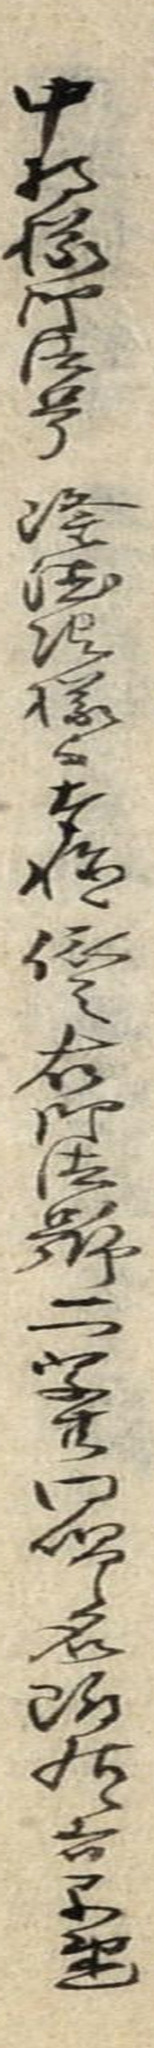中将様御法号隆徳院様と奉称候依之右御法号二字共同唱之名附居候者早速
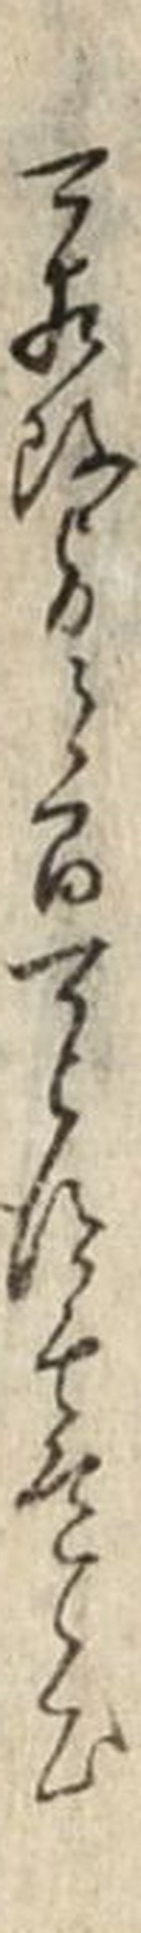可相改旨に候間可被得其意候以上
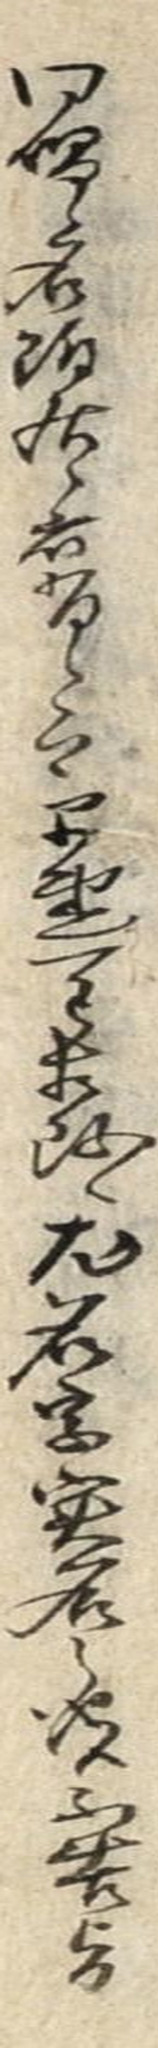同唱之名附居候者有之候はゝ早速可相改候尤名字実名之儀は不苦旨
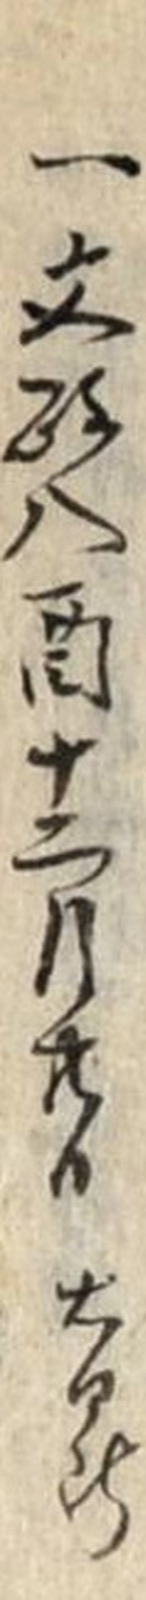一文政八酉十二月廿日右同断
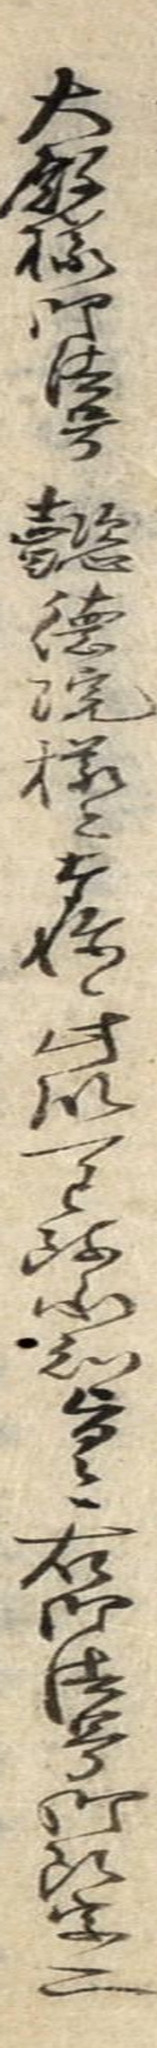大殿様御法号懿徳院様と奉称候此段可被致承知旨に候右御法号御頭字二
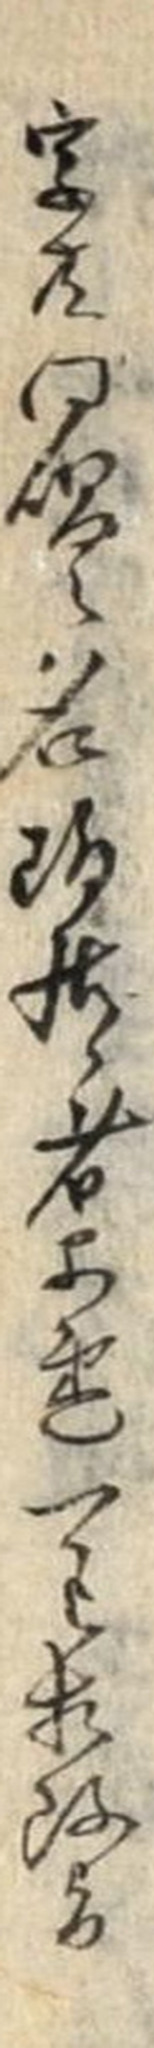字共同唱之名附居候者早速可被相改候旨
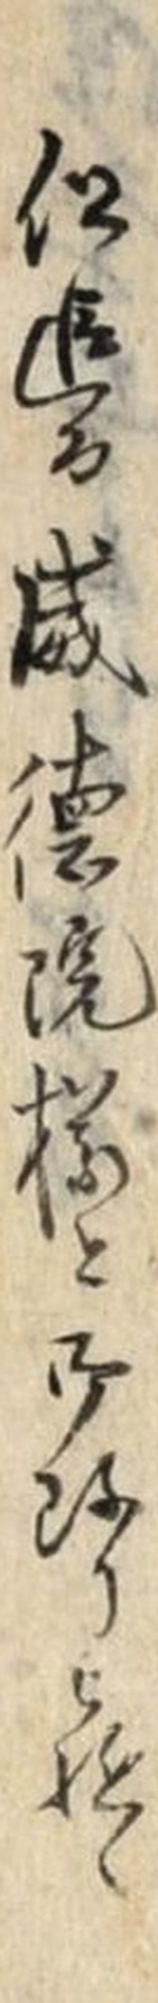但追而威徳院様と御改り被遊候
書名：蒐輯之部
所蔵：福井県文書館 Fukui Prefectural Archives
